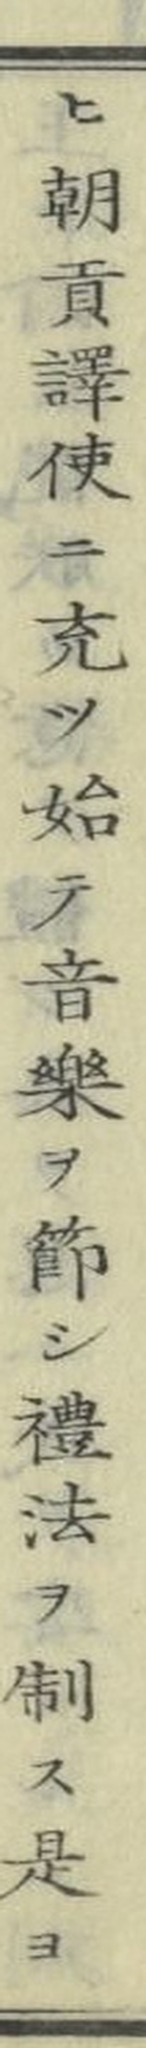ヒ朝貢譯使ニ充ツ始テ音樂ヲ節シ禮法ヲ制ス是ヨ
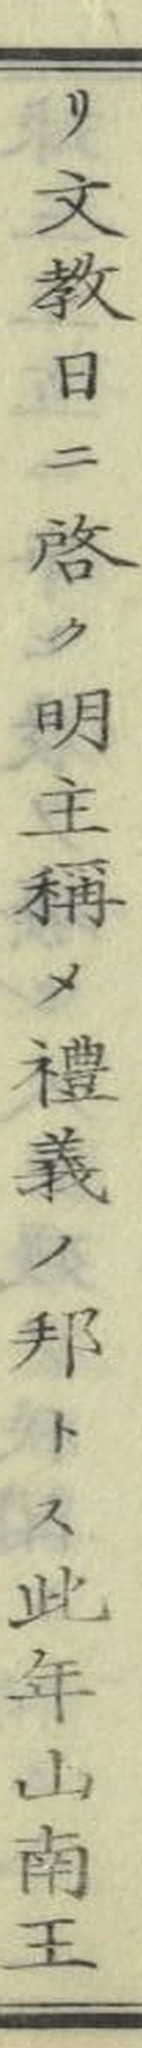リ文教日ニ啓ク明主稱シテ禮義ノ邦トス此年山南王
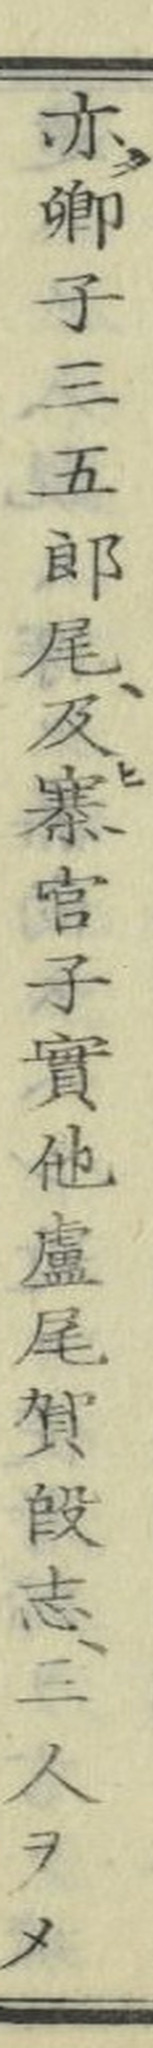亦卿子三五郎尾、及寨子實他盧尾賀段志、三人ヲシテ
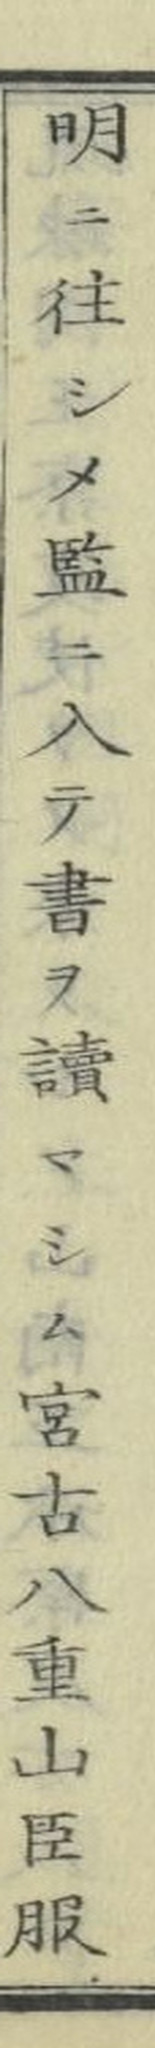明ニ往シメ監ニ入テ書ヲ讀マシム宮古八重山臣服
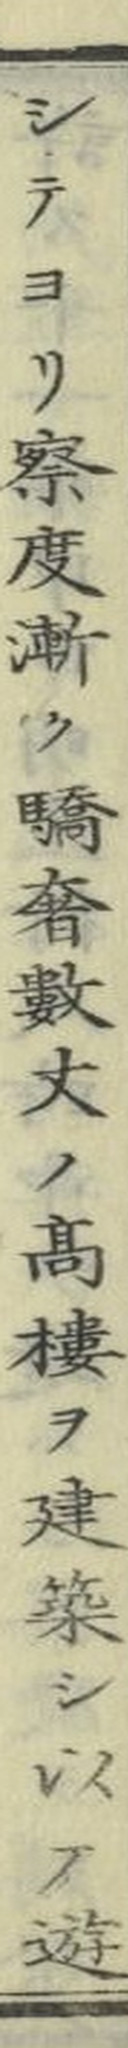シテヨリ察度漸ク驕奢數丈ノ髙樓ヲ建築シ以テ遊
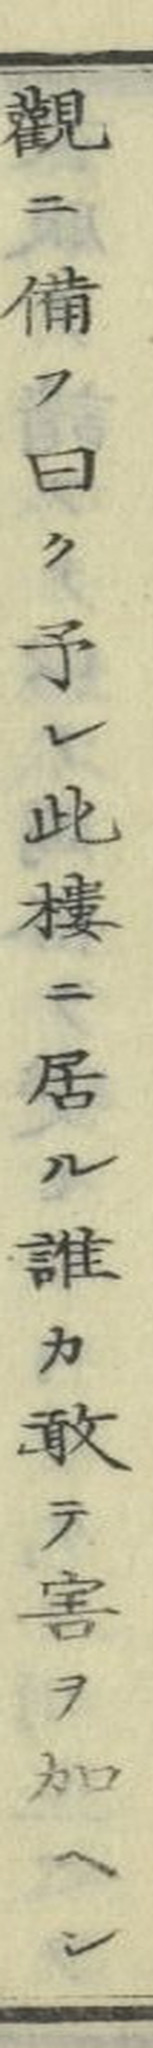觀ニ備フ曰ク予レ此樓ニ居ル誰カ敢テ害ヲ加ヘン
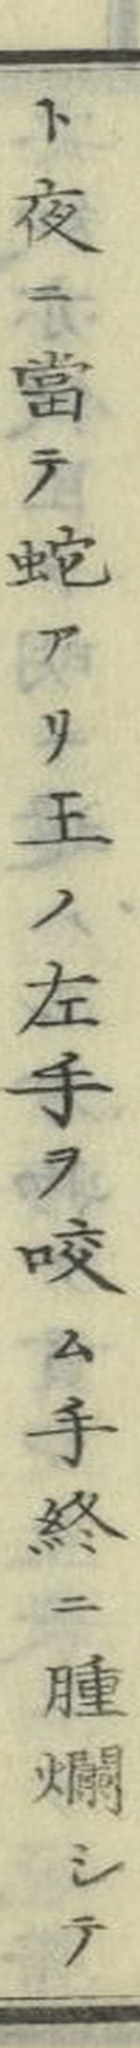ト夜ニ當テ蛇アリ王ノ左手ヲ咬ム手終ニ腫爛シテ
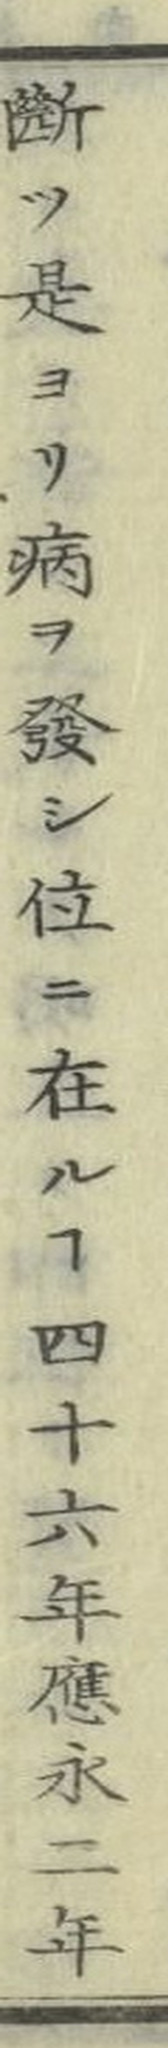斷ツ是ヨリ病ヲ發シ位ニ在ルコト四十六年應永二年
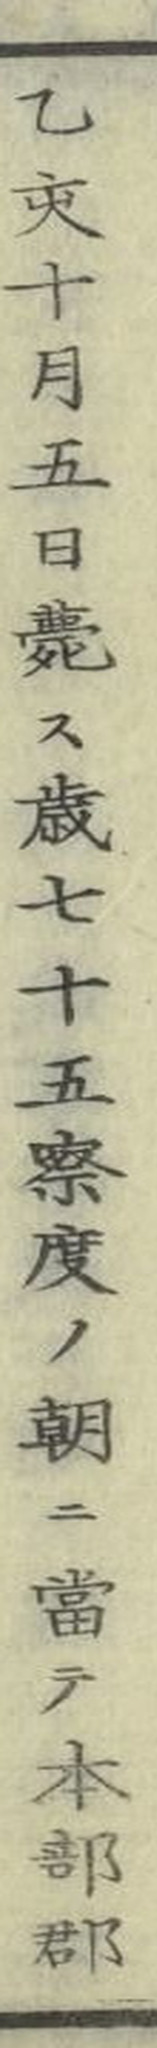乙亥十月五日薨ス歳七十五察度ノ朝ニ當テ本部郡
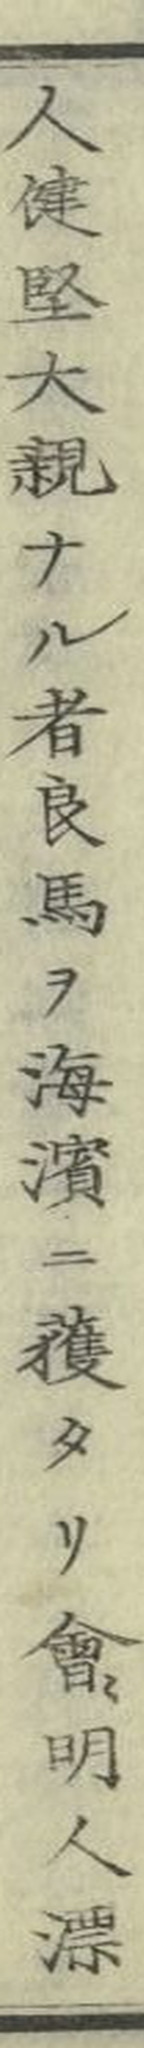人健堅大親ナル者良馬ヲ海濱ニ獲タリ會〻明人漂
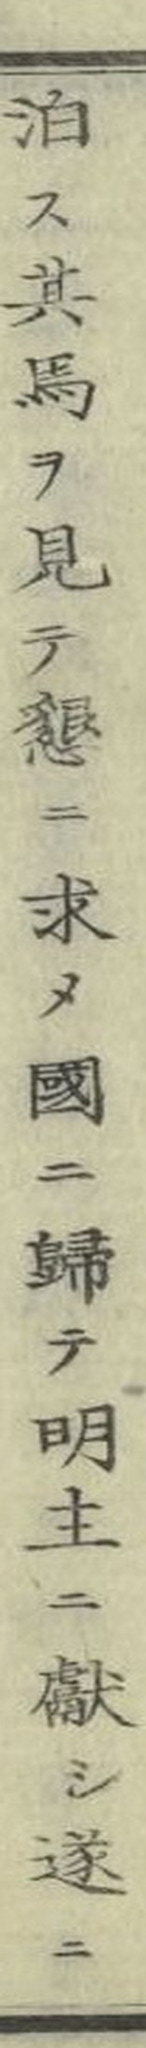泊ス其馬ヲ見テ懇ニ求メ國ニ歸テ明主ニ獻シ遂ニ
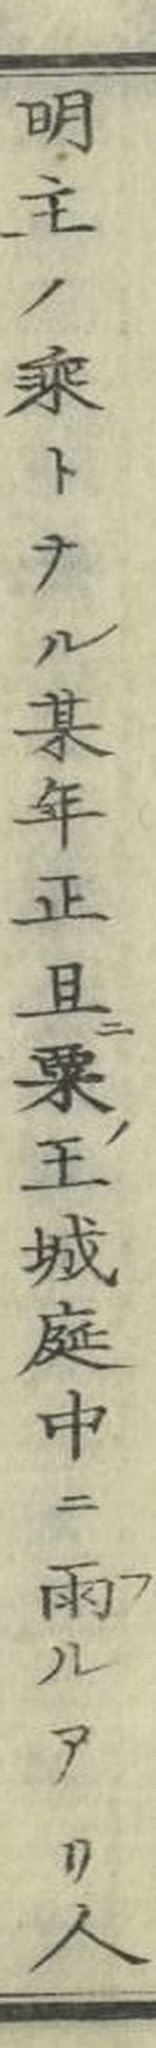明主ノ乘トナル某年正月且粟王城庭中ニ雨ルアリ人
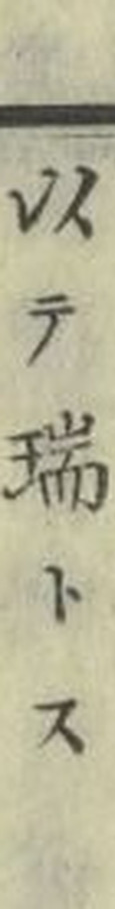以テ瑞トス
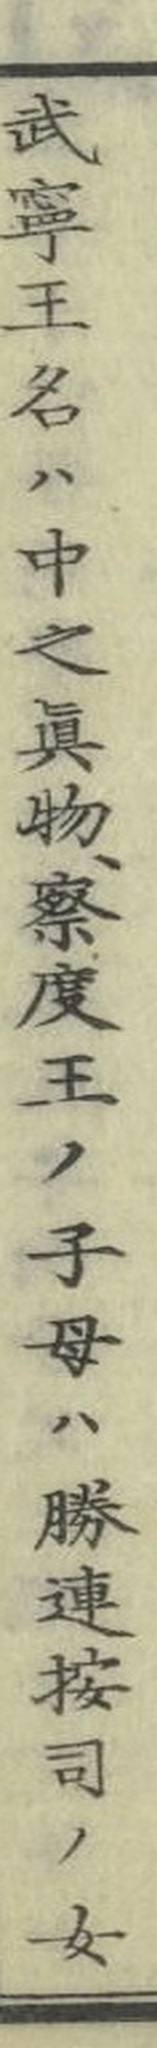武寧王名ハ中之眞物、察度王ノ子母ハ勝連按司ノ女

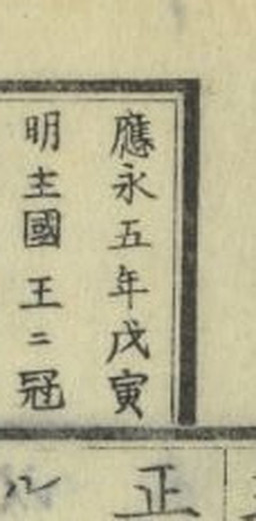應永五年戌寅
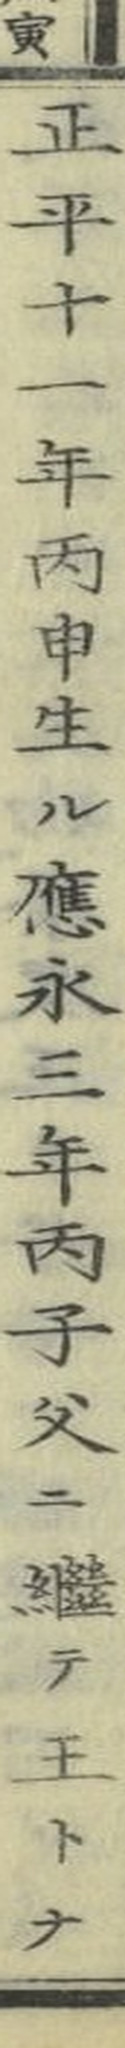正平十一年丙申生ル應永三年丙子父ニ繼テ王トナ
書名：琉球藩史 一之巻
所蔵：University of the Ryukyus Library
